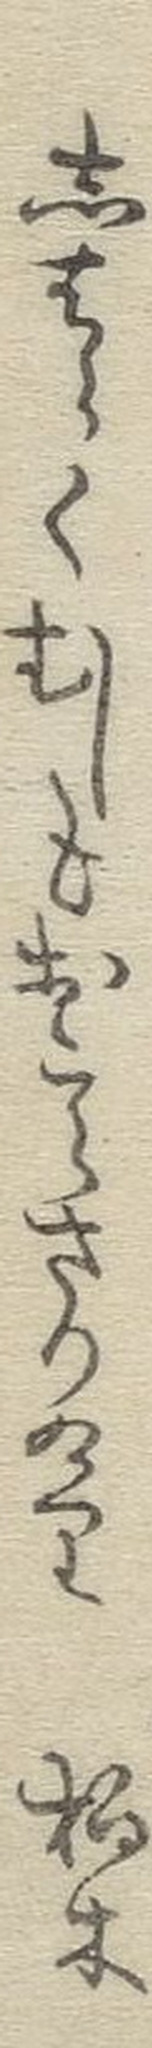しはらくむしもおこらさりけり柏木

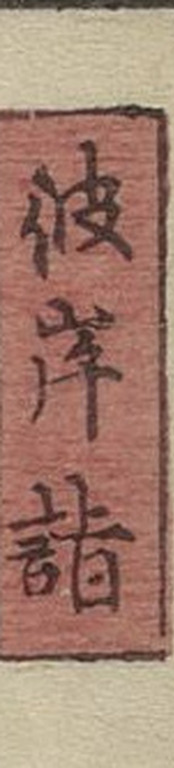彼岸詣
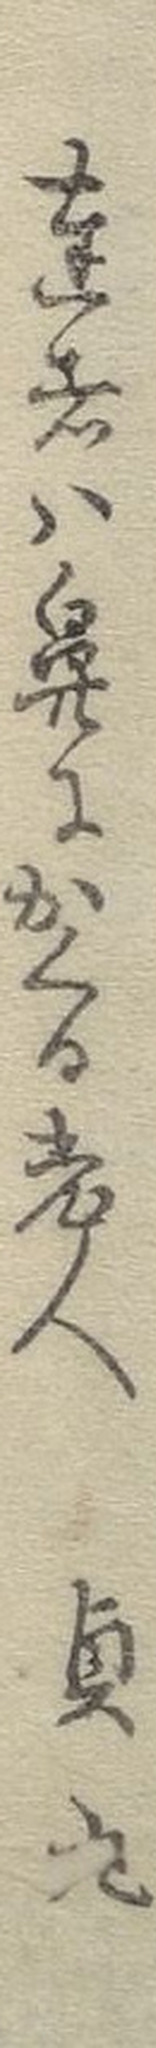達者は鼻にかくる老人貞丸
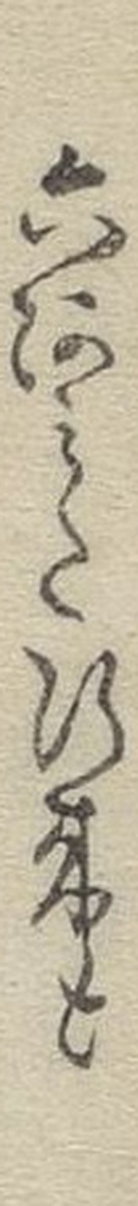六あみた行来も
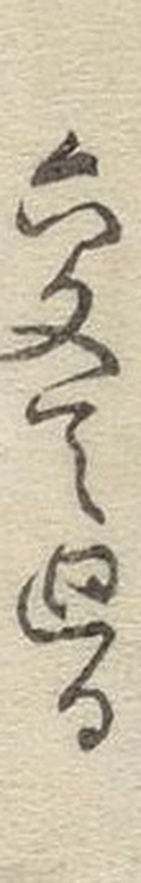六文で廻る
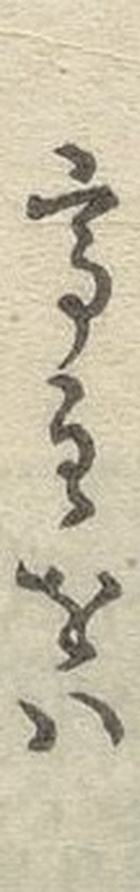亭主をは
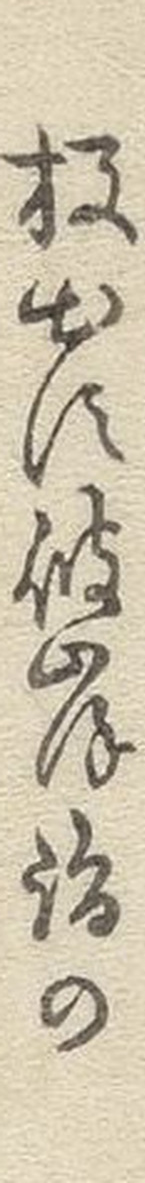投出す彼岸詣の
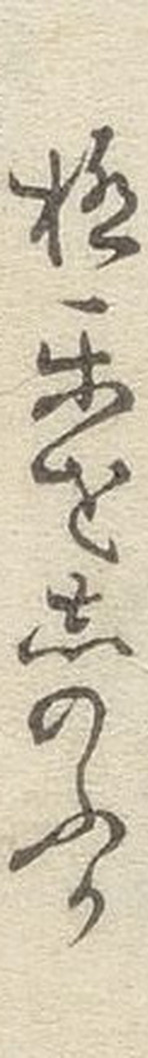極楽をしのふか
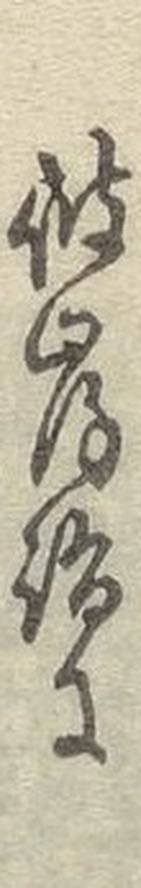彼岸詣に
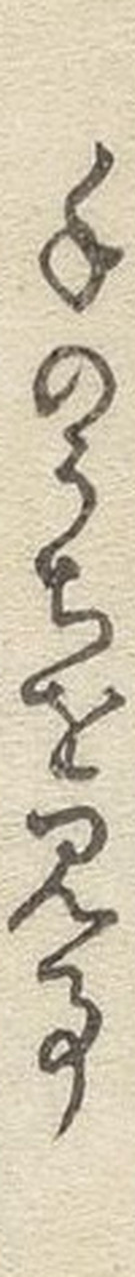手のうちを見事
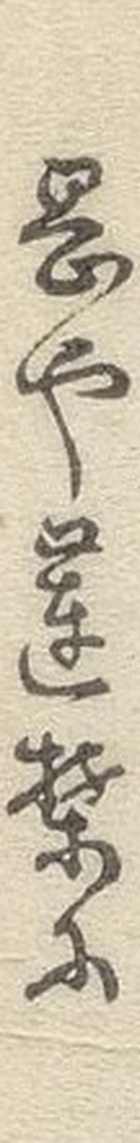岡や蓮葉に
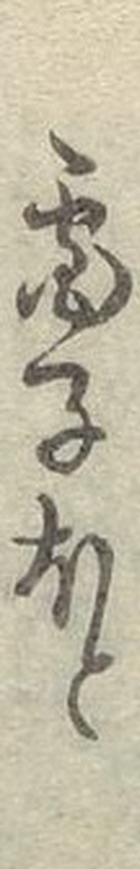団子ほと
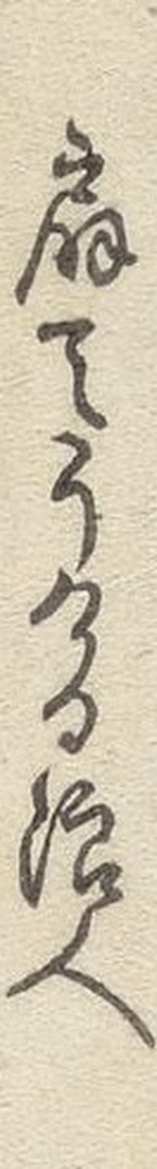扇て受ける浪人
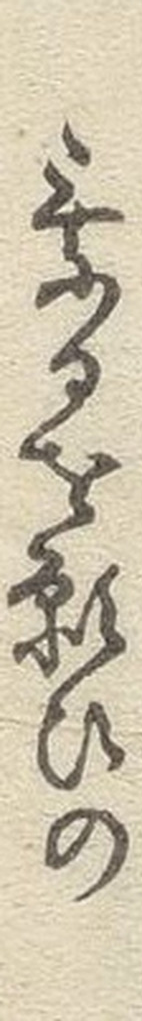乗るを願ひの
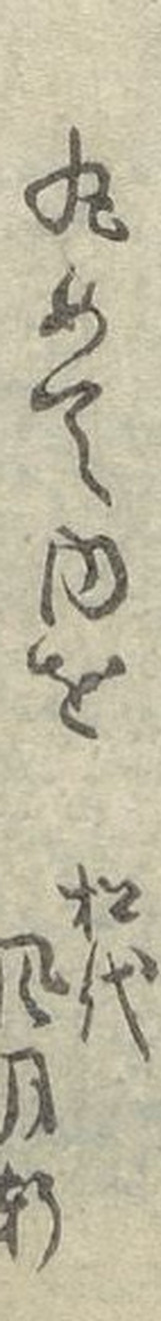丸めて内を松代
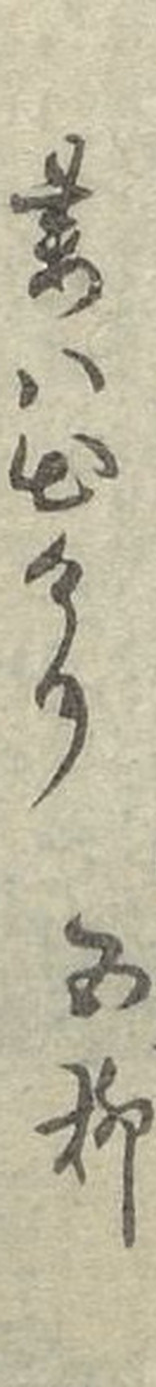妻は出けり風月軒
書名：Picture Album of People with Kyōka (Light Verse) (Kyōka shiki jinbutsu 狂歌四季人物)
